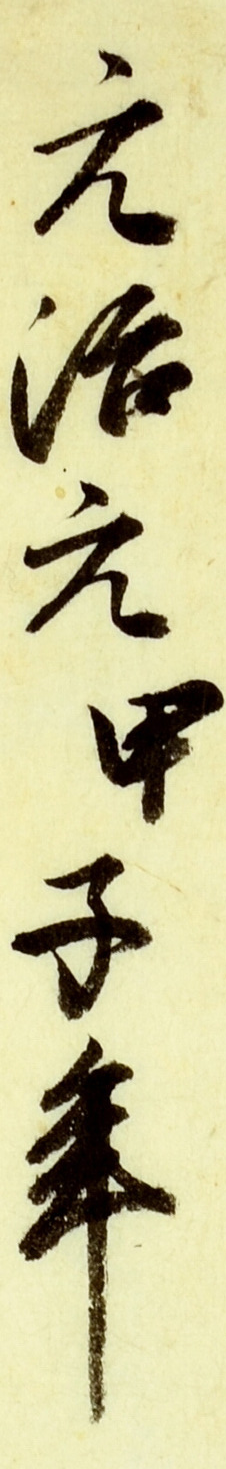元治元甲子年
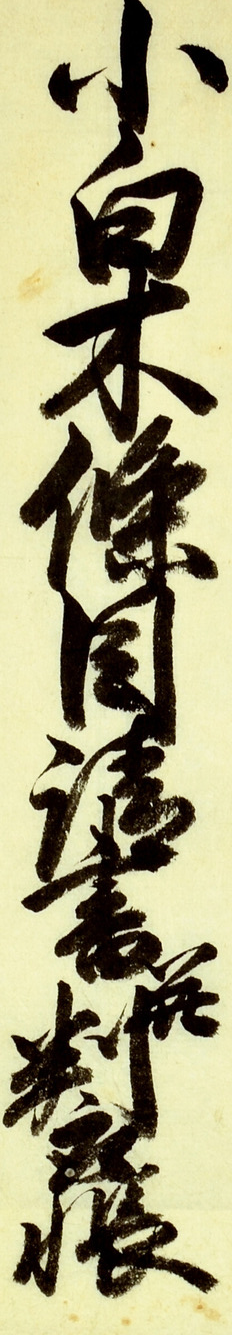小白木條目請書并判取帳
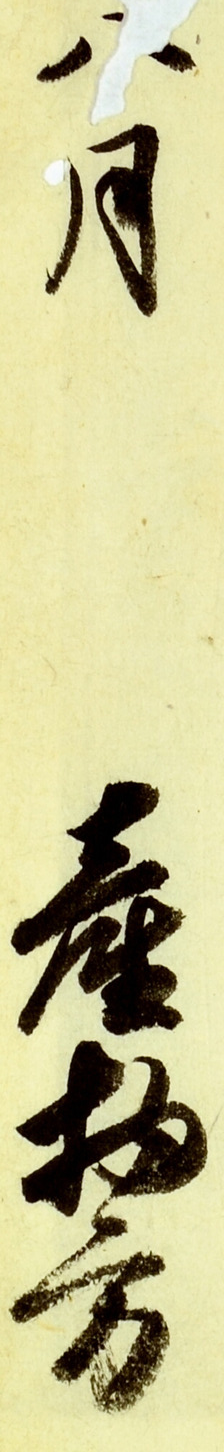八月産物方

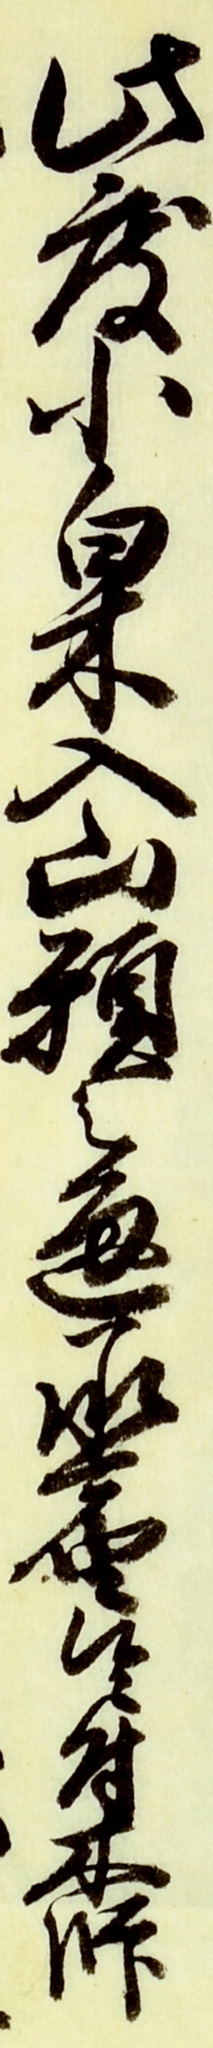此度小白木入山願之通承届候ニ付木師
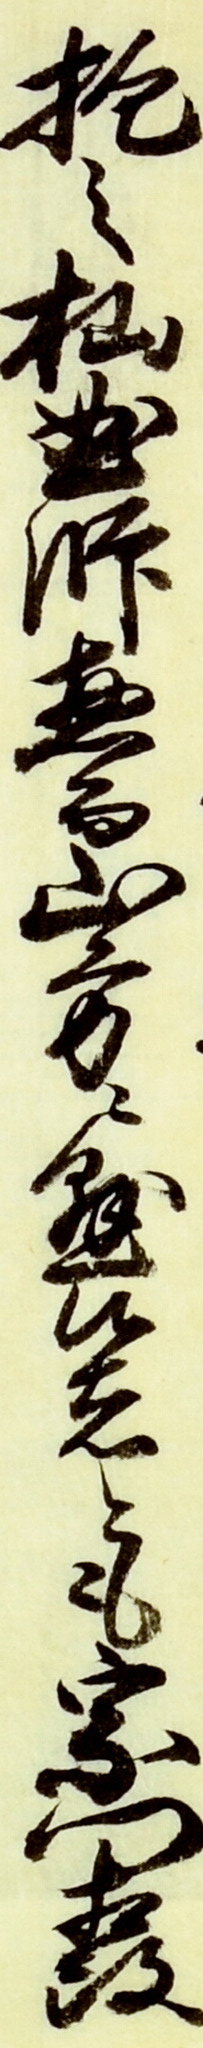抱之杣曲師惣而山方ニ懸候者とも宗門相改
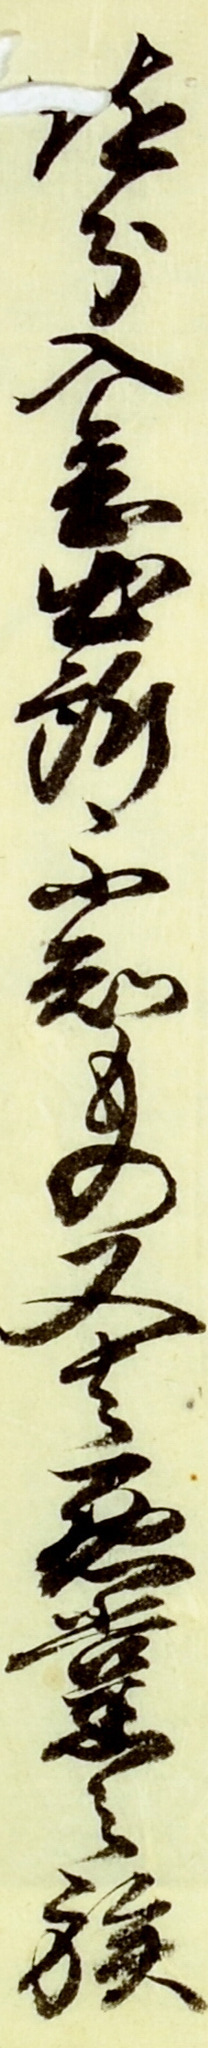随分入念出所不知もの又者悪党之族
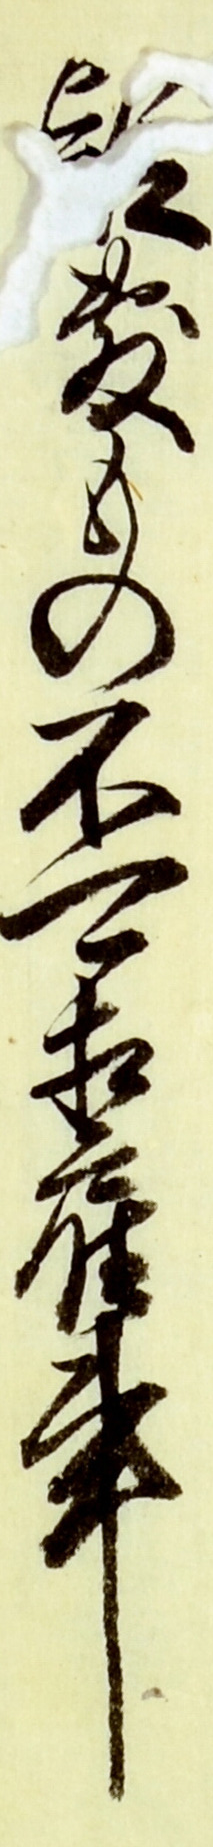疑敷もの不可相雇事
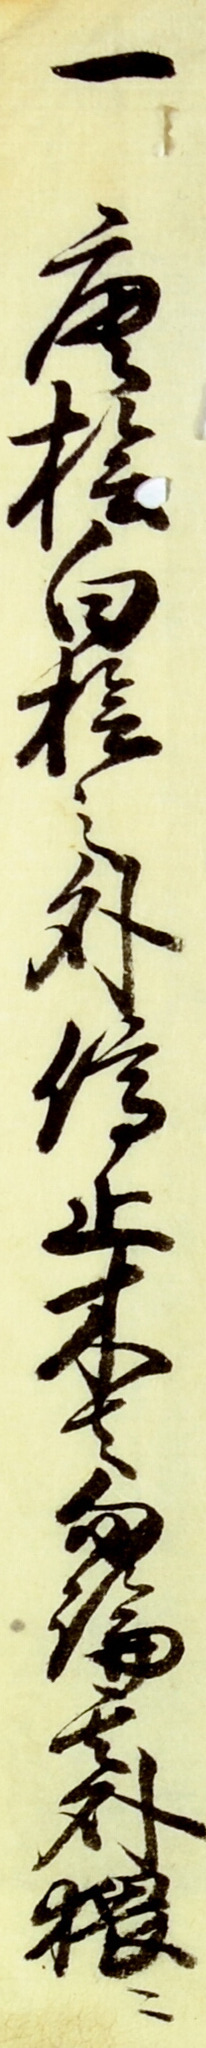一唐桧白桧之外停止木者勿論其外猥ニ

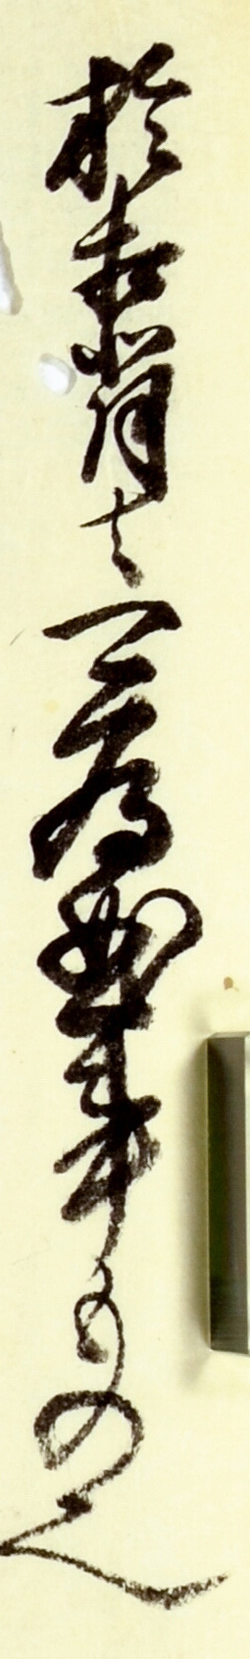於相背者可為曲事もの也
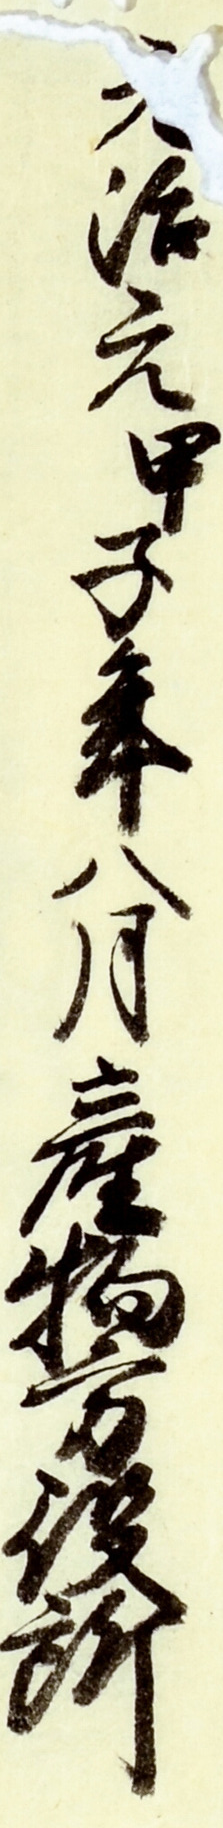元治元甲子年八月産物方役所

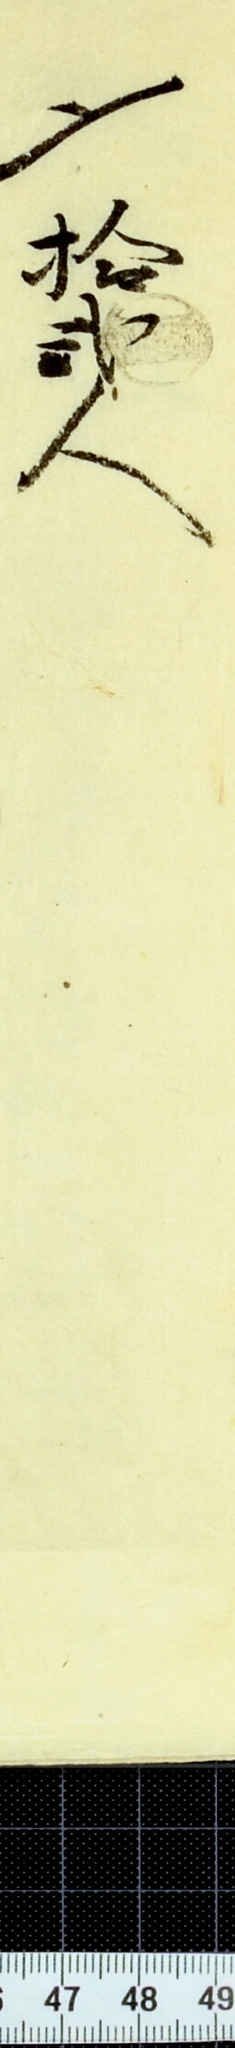〆拾弐人
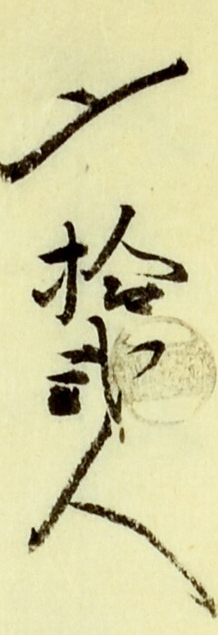〆拾弐人
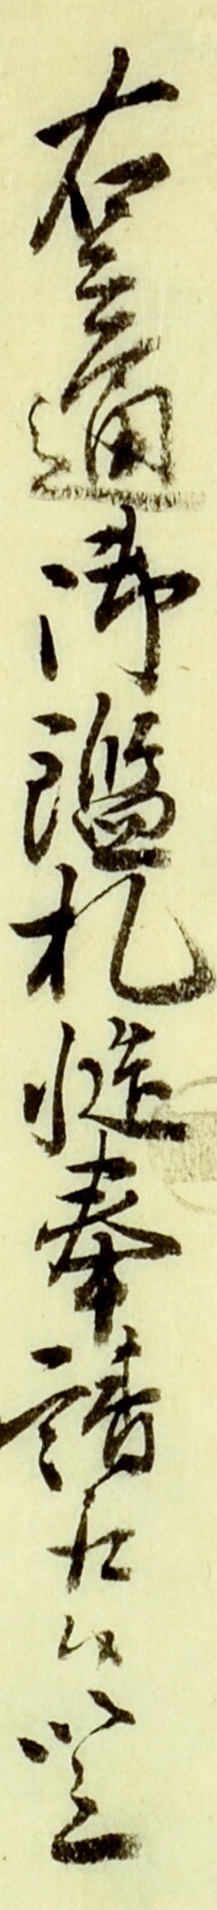右之通御鑑札慥奉請取候以上
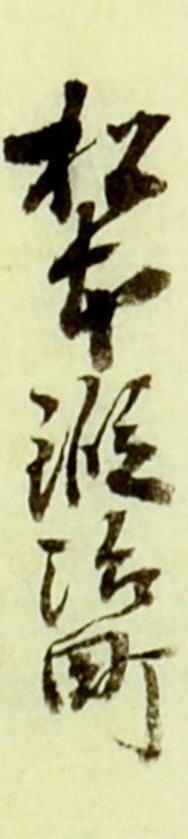松本鍛冶町
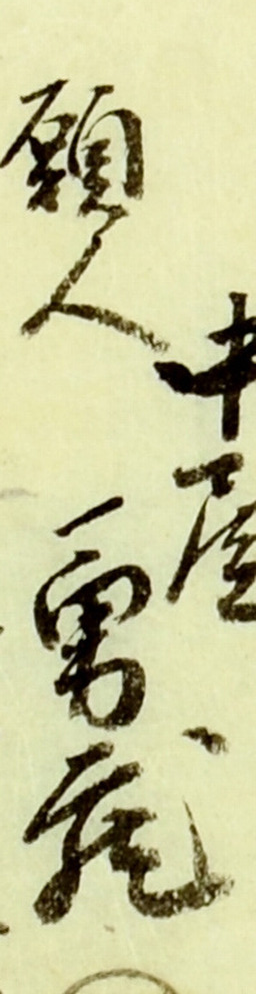願人勇蔵
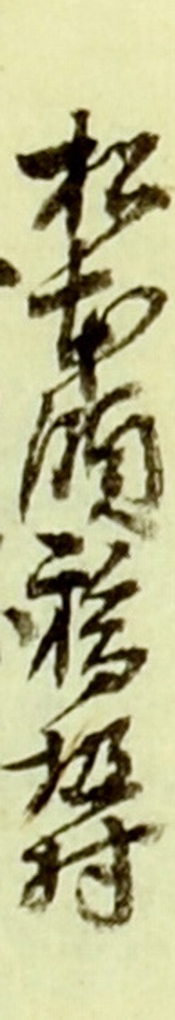松本領稲扱村
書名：小白木條目請書并判取帳
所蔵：伊那市立高遠町図書館・合同会社AMANE
